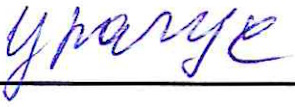урагус
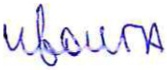иволга
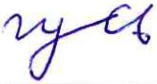гусь
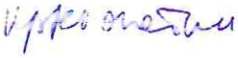крхо опейки
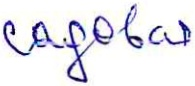садовая
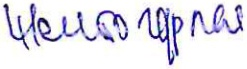желтогорлая
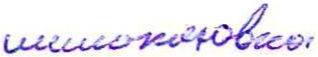шилоклювка
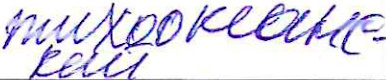тихоокеанс-кий
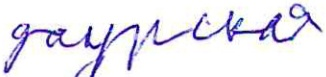даурская
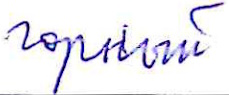горный
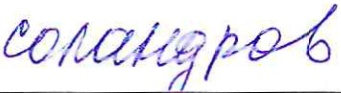соландров
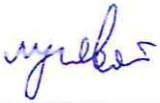лугявяй
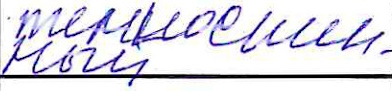темноспин-ный
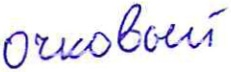очковый
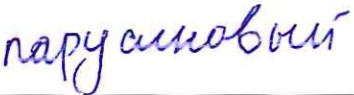парусиновый
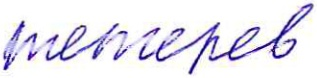тетерев
